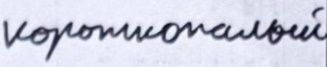короткопалый
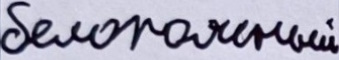белопоясный
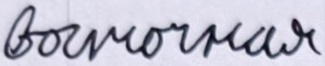восточная
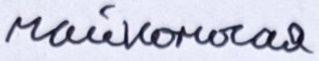чайконосая
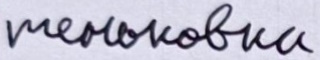теньковка
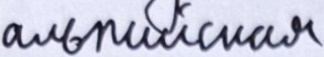альпийская
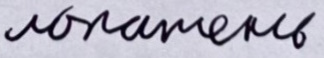лопатень
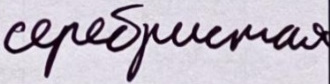серебристая
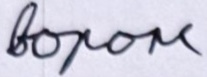ворон
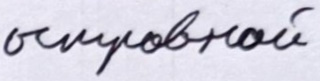островной
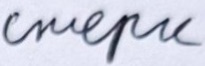стерх
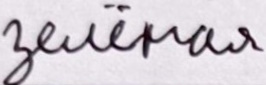зелёная
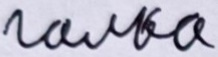галка
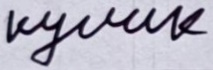кулик
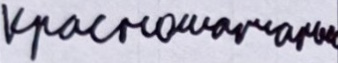красношамани
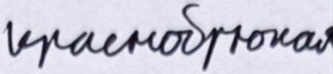краснобрюхая
